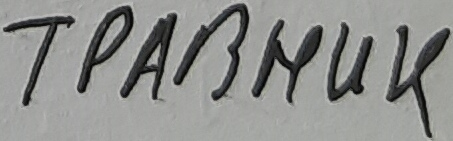травник
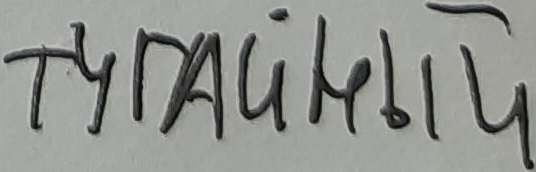тугайный
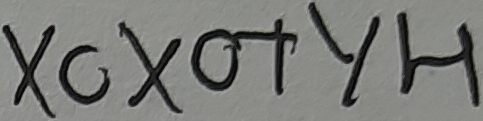хохотун
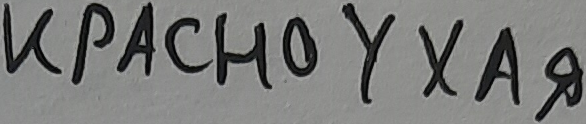красноухая
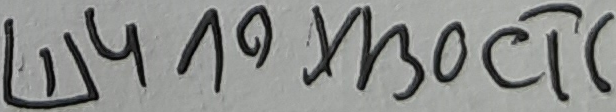шилохвость
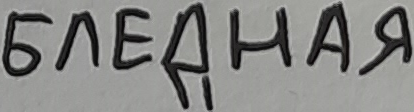бледная
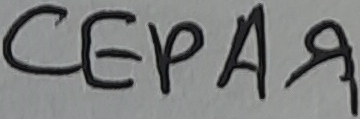серая
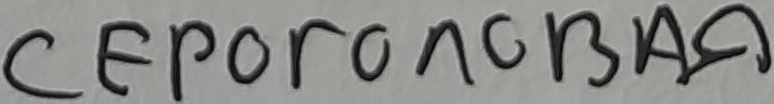сероголовая
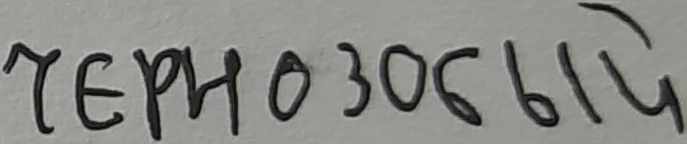чернозобый
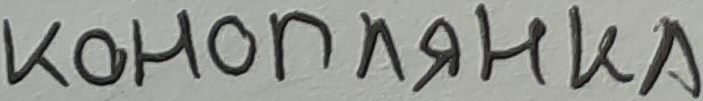коноплянка
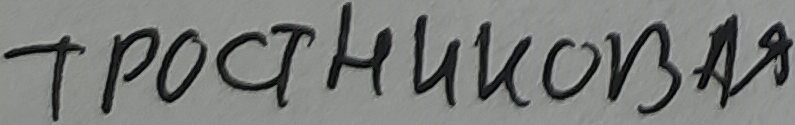тростниковая
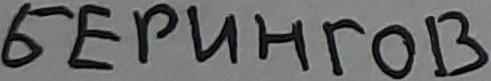берингов
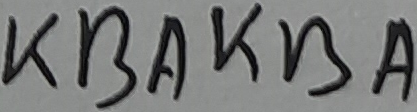кваква
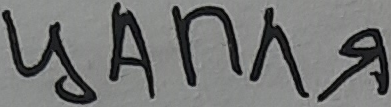цапля
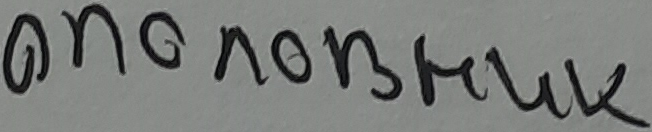ополовник
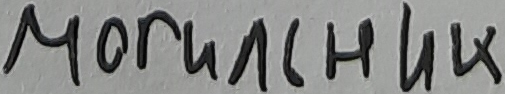могильник
